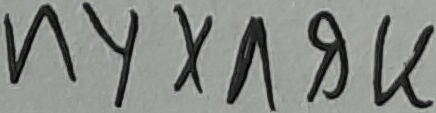пухляк
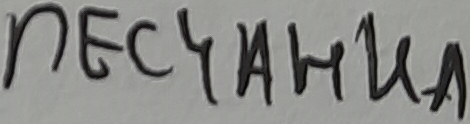песчанка
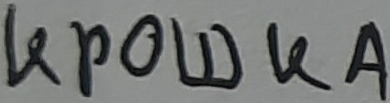крошка
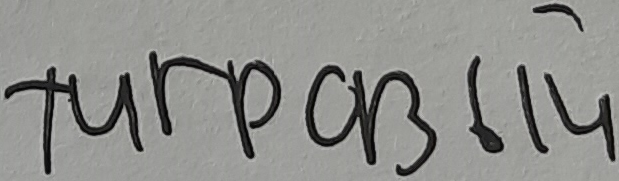тигровый
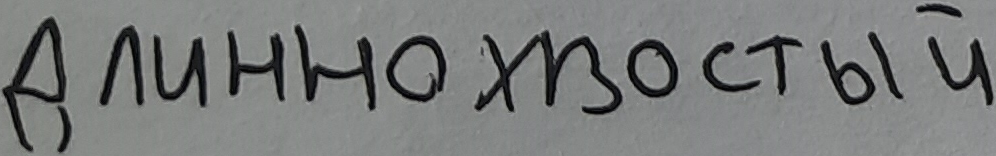длиннохвостый
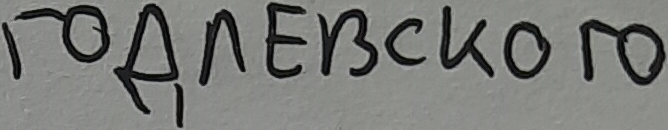годлевского
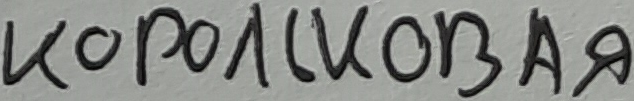корольковая
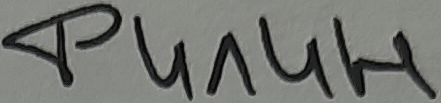филин
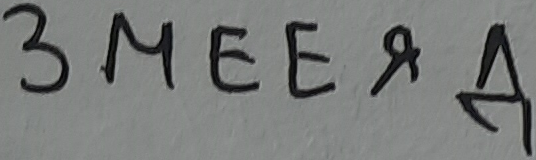змееяд
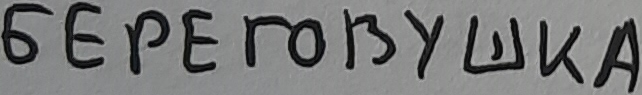береговушка
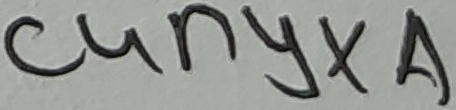сипуха
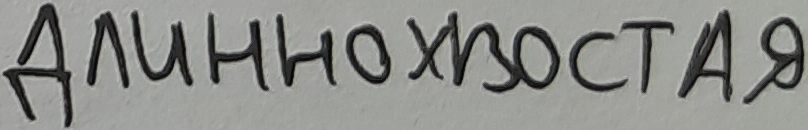длиннохвостая
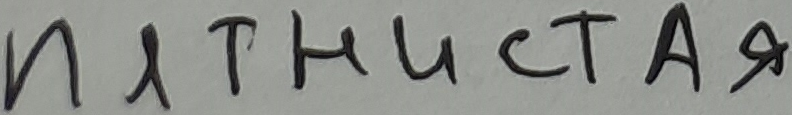пятнистая
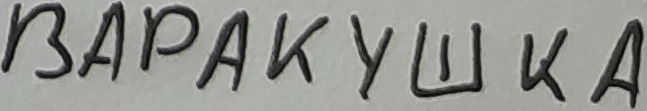варакушка
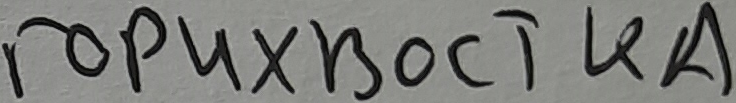горихвостка
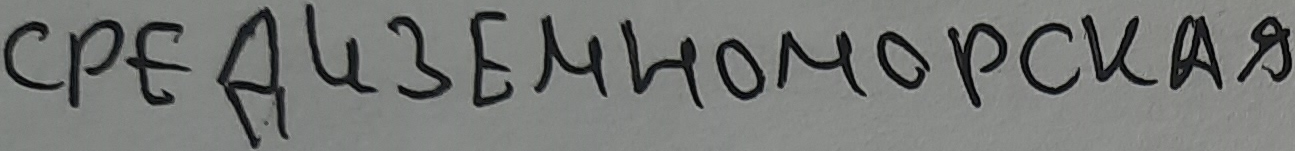средиземноморская
